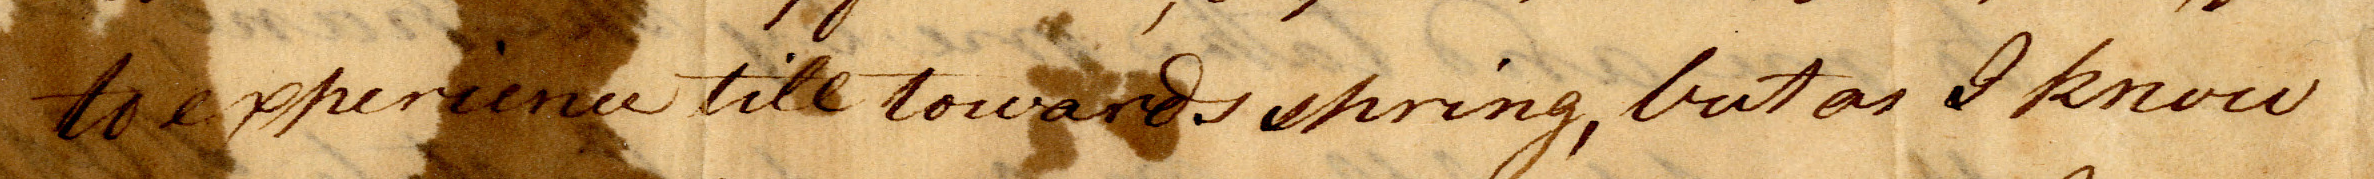to experience till towards spring, but as I know
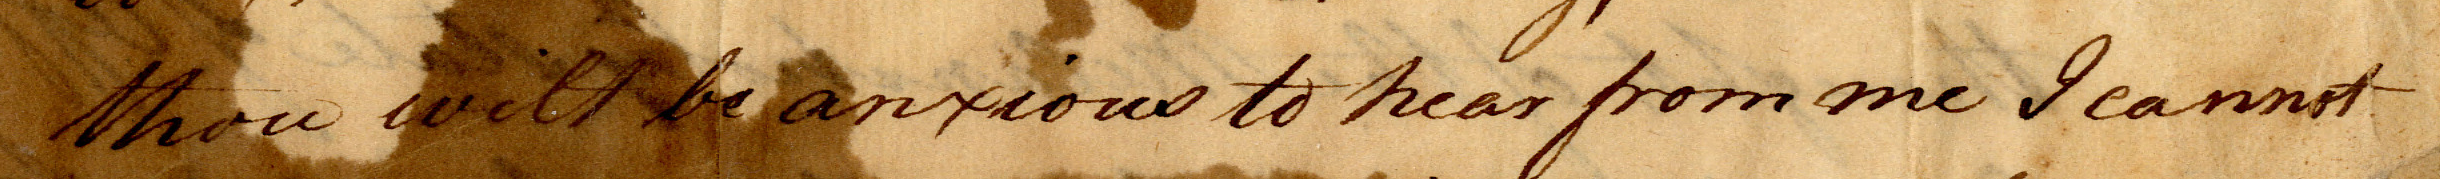thou wilt be anxious to hear from me I cannot
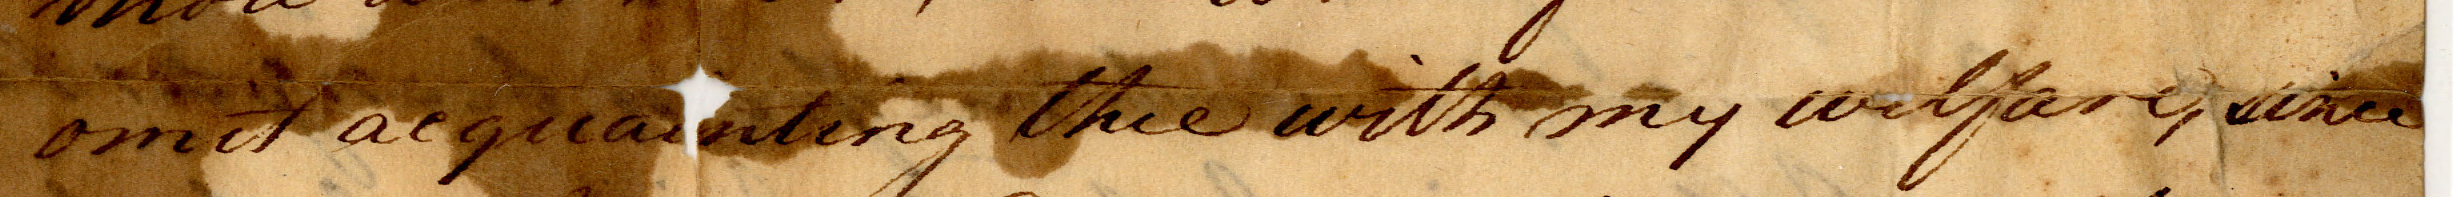omit acquainting thee with my welfare, since
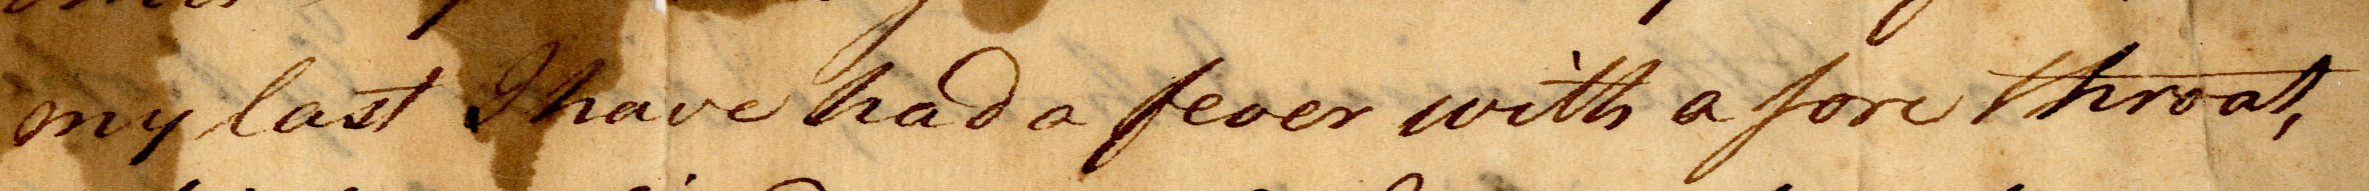my last I have had a fever with a sore throat,
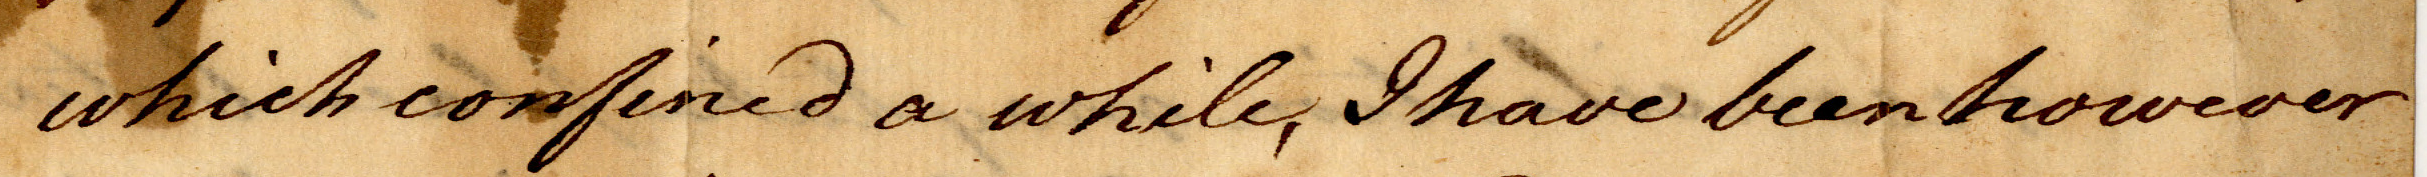which confined a while, I have been however
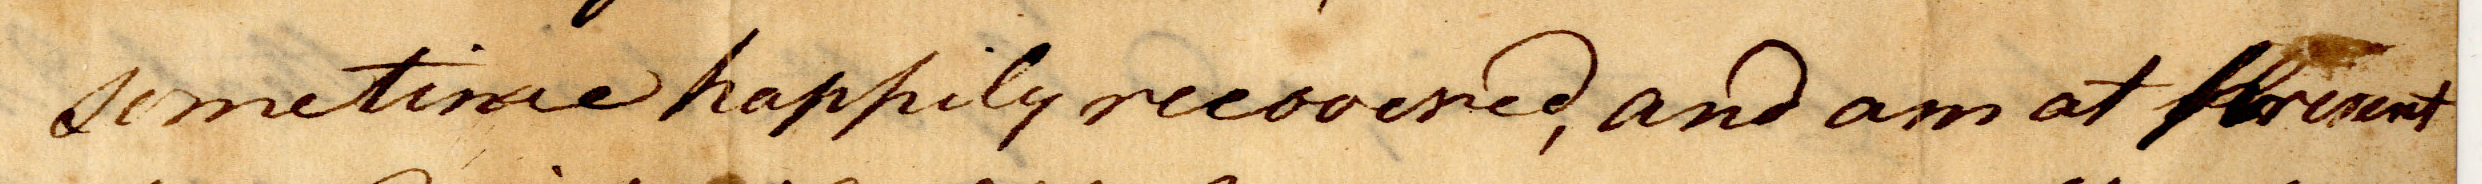sometime happily recovered, and am at present
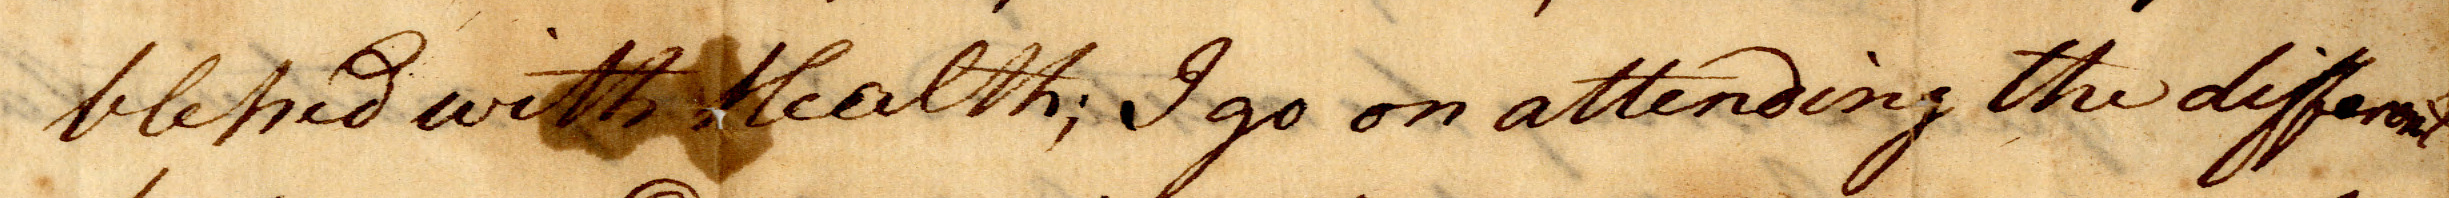blessed with Health; I go on attending the different
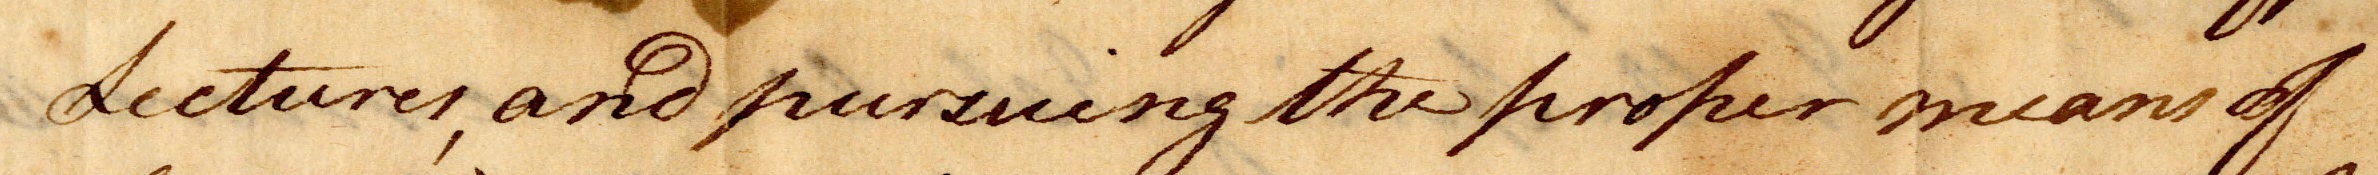Lectures, and pursuing the proper means of
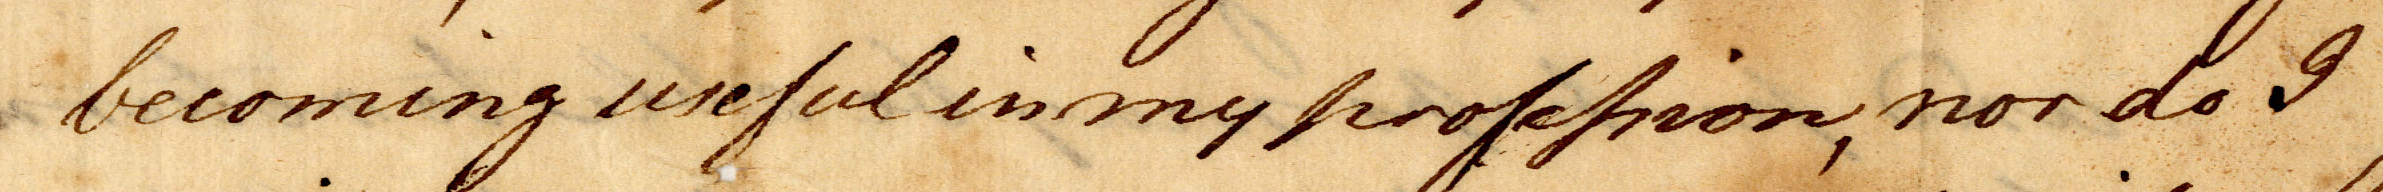becoming useful in my profession, nor do I
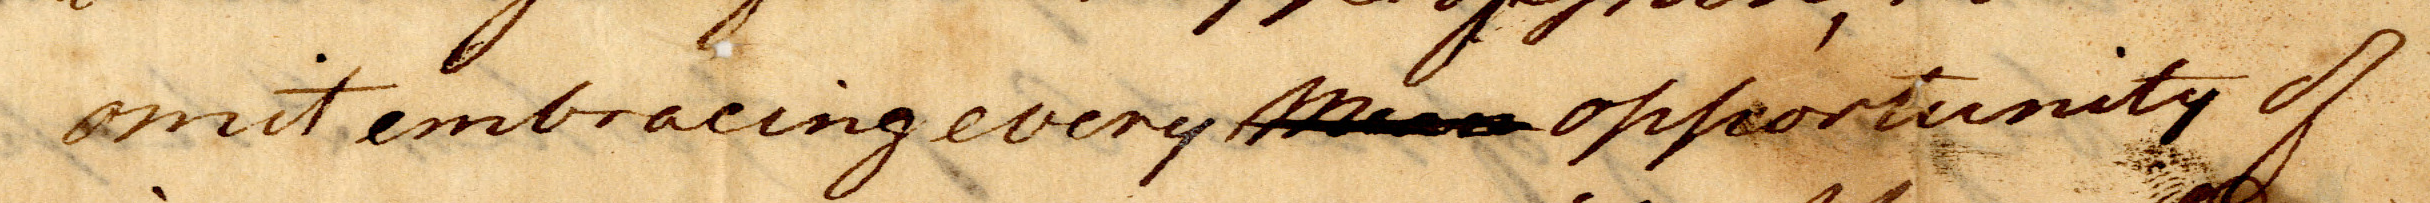omit embracing every [Means] opportunity of
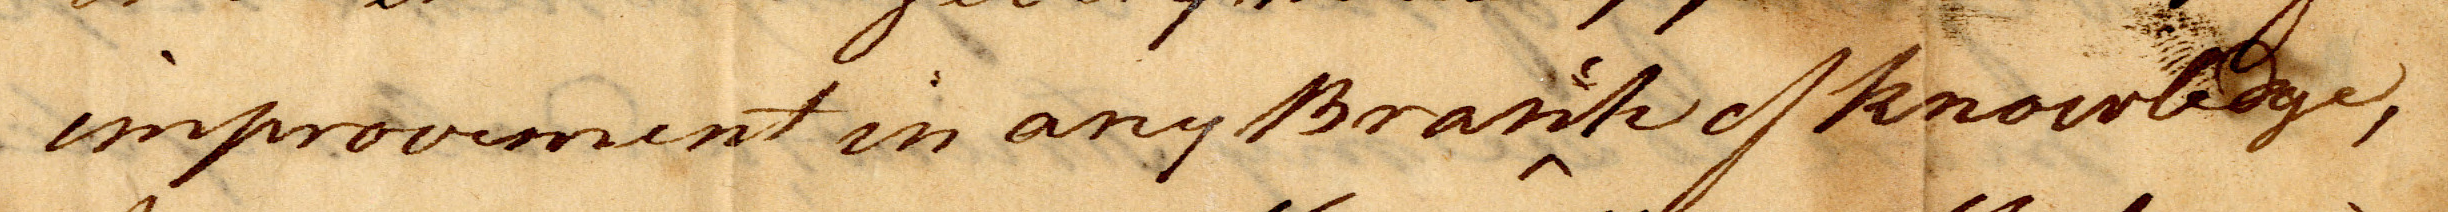improvement in any Bran^ch of knowledge,
